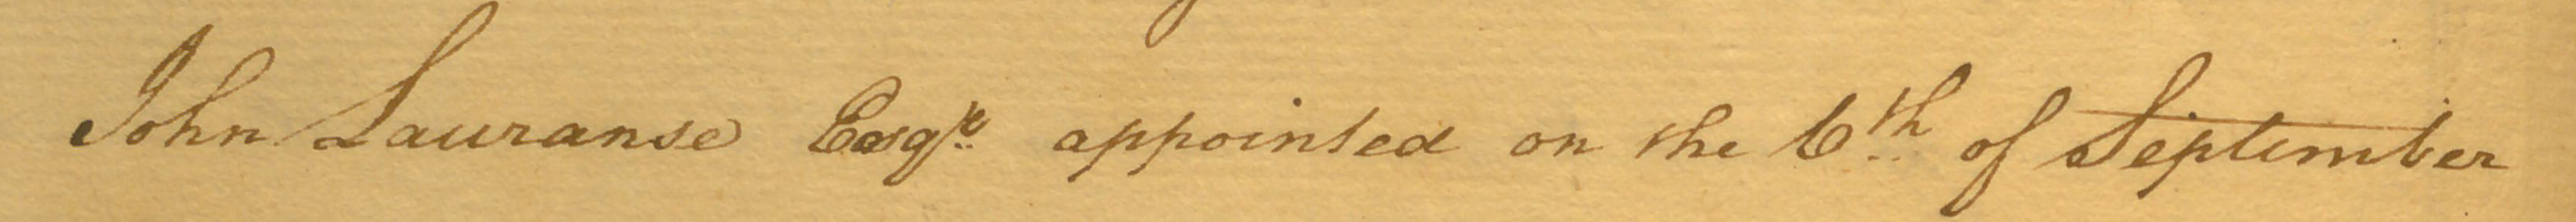John Lauranse Esq^r. appointed on the 6^th. of September
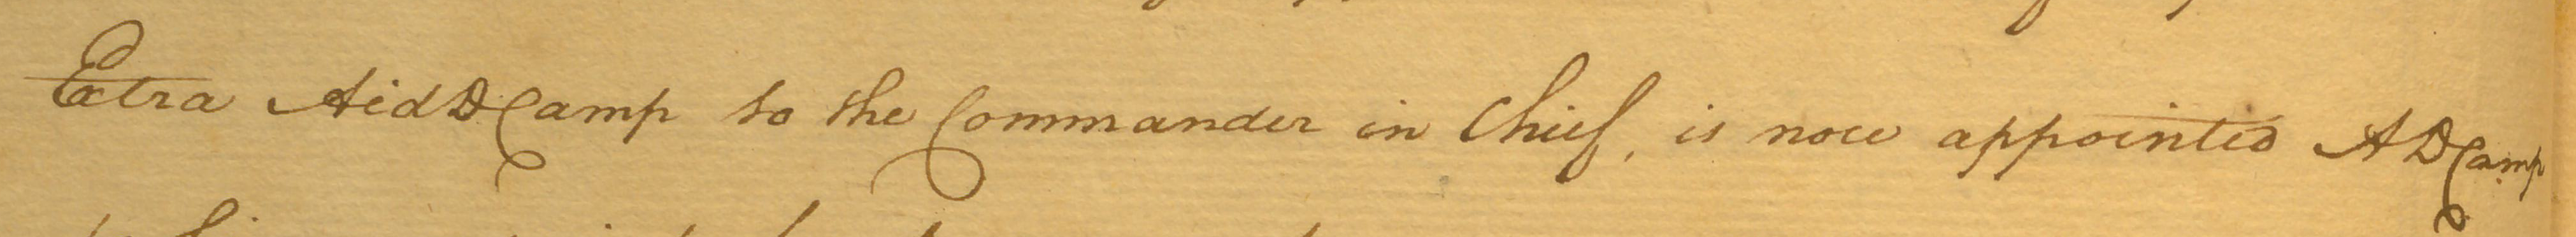Extra Aid D Camp to the Commander in Chief, is now appointed A D Camp
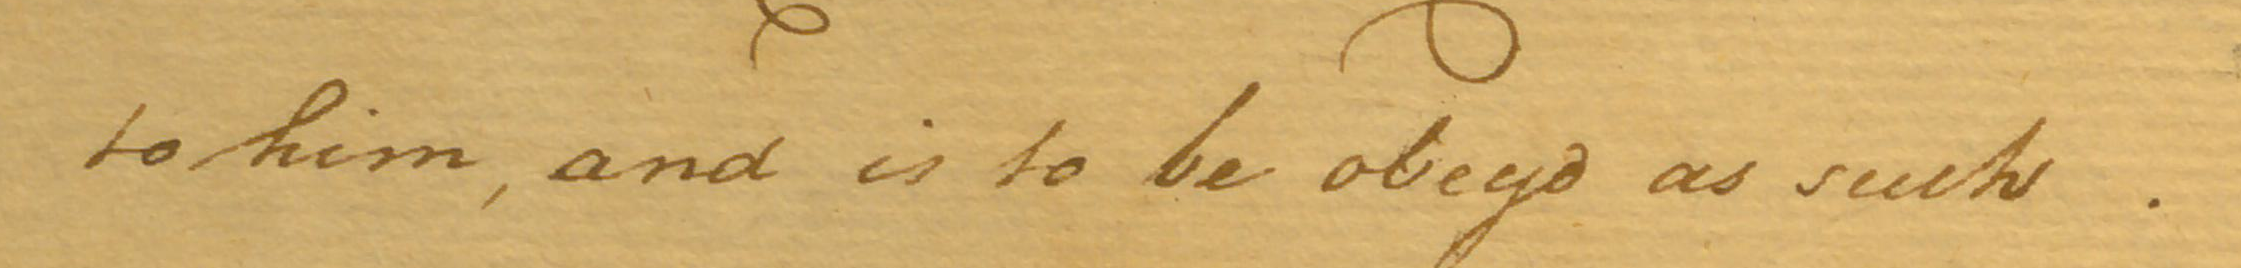to him, and is to be obeyd as such.
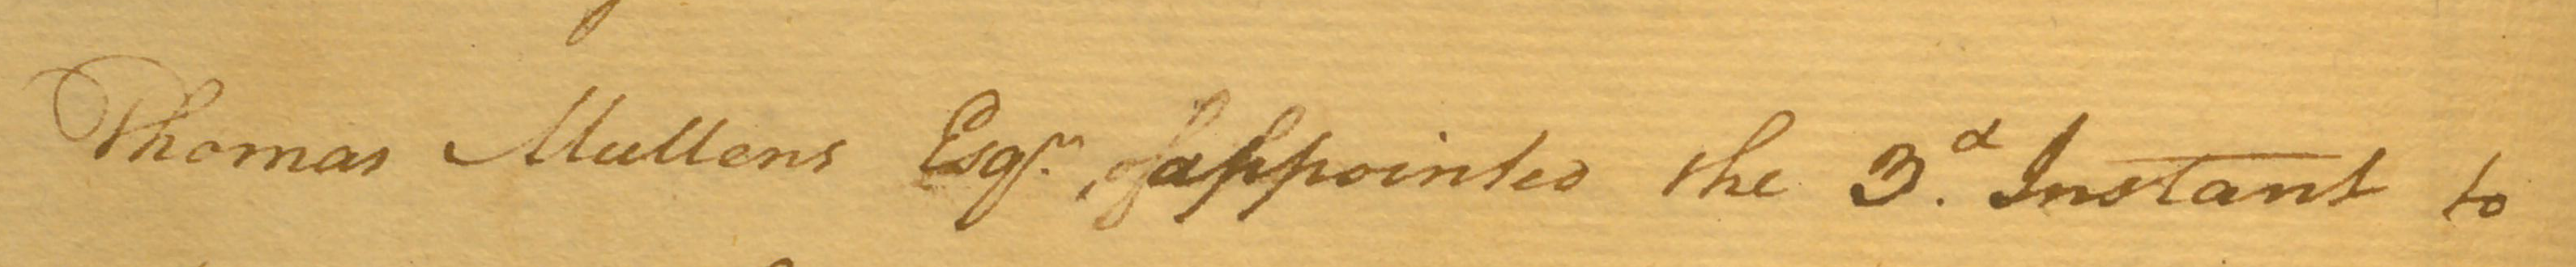Thomas Mullens Esq^r. appointed the 3^d. Instant to
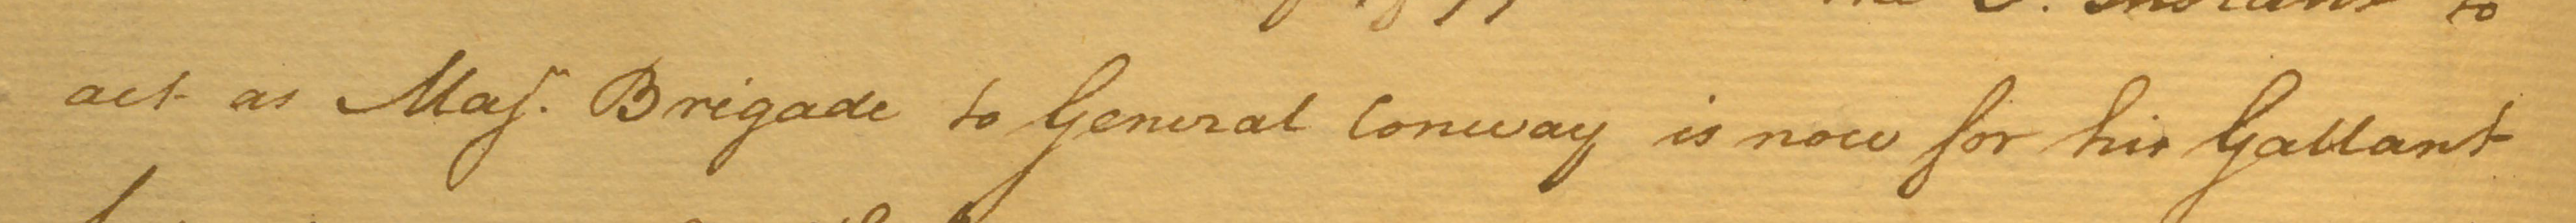act as Maj^r. Brigade to General Conway is now for his Gallant
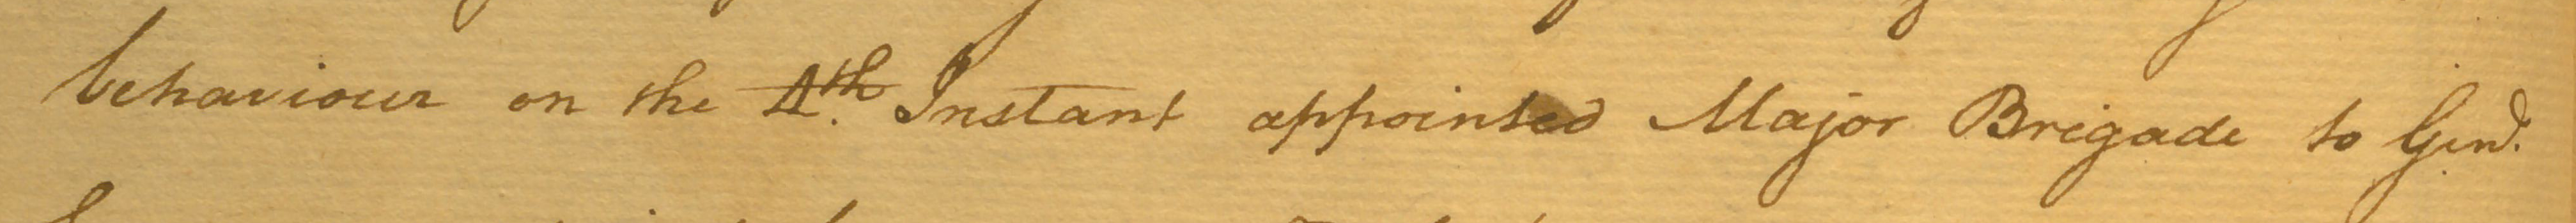behaviour on the 4^th Instant appointed Major Brigade to Gen^l.
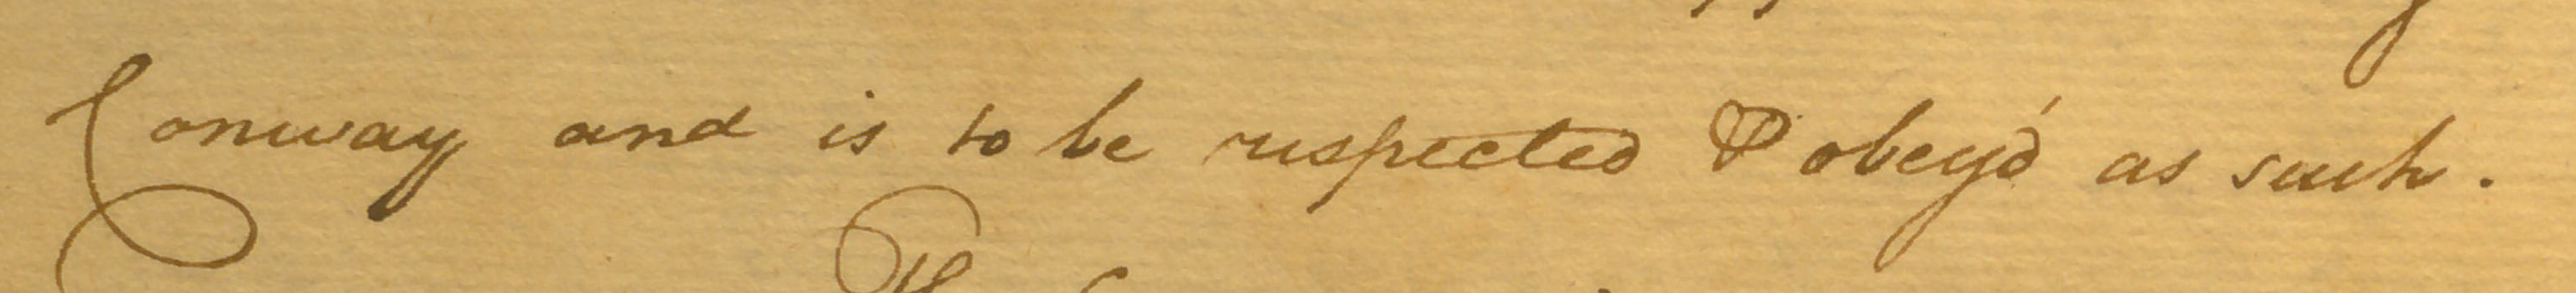Conway and is to be respected & obey'd as such.
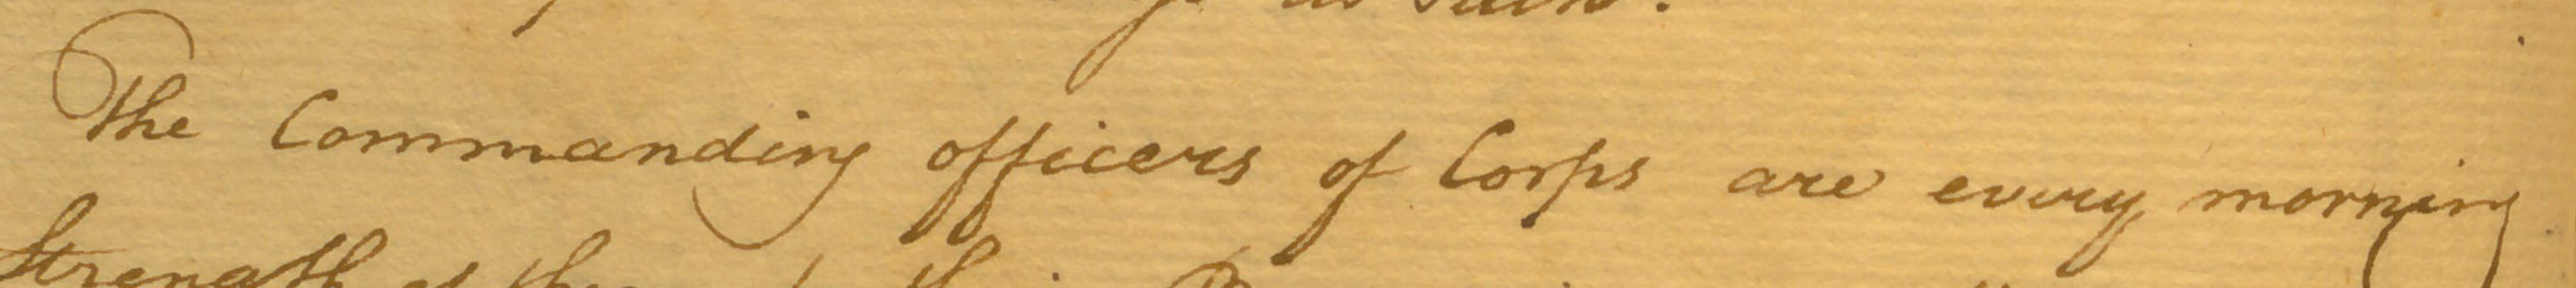The Commanding officers of Corps are every morning
